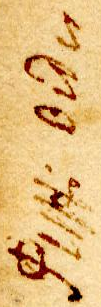Pllh Order
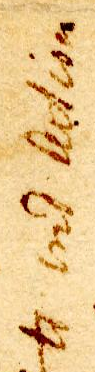to end Action
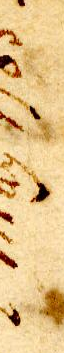2 May 1783
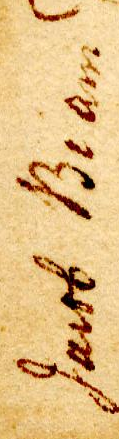Jacob Beam
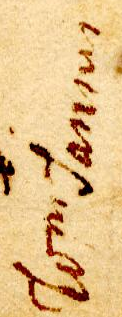W^m Tanner
